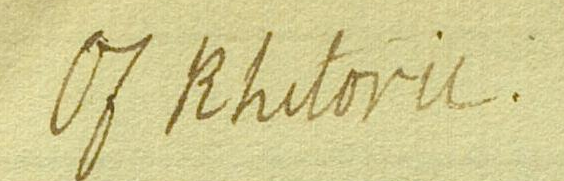Of Rhetoric.
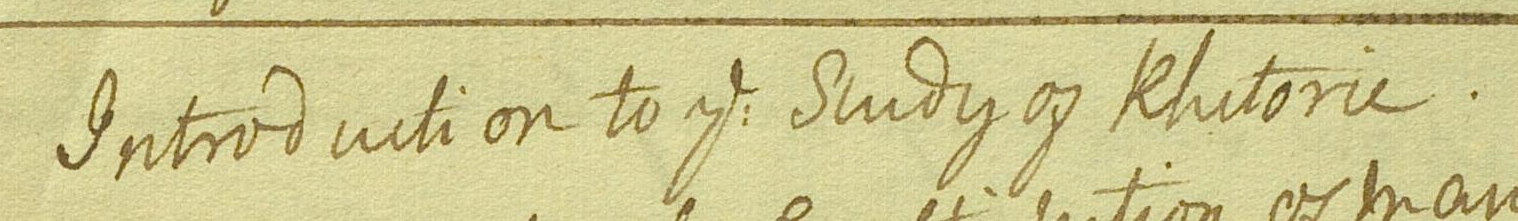Introduction to y^e: Study of Rhetoric.
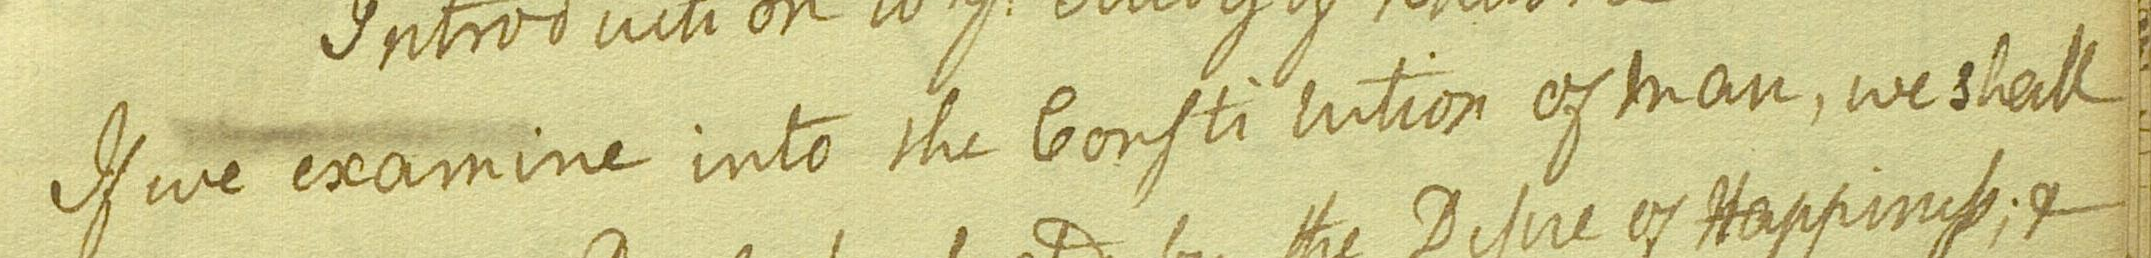If we examine into the Constitution of man, we shall
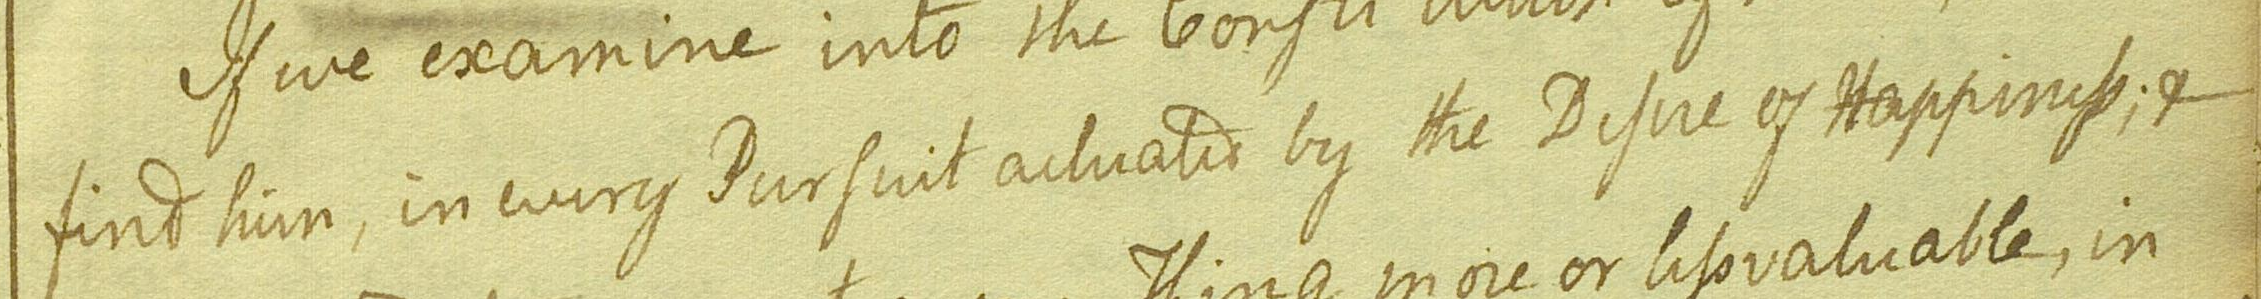find him, in every Pursuit actuated by the Desire of Happiness; &
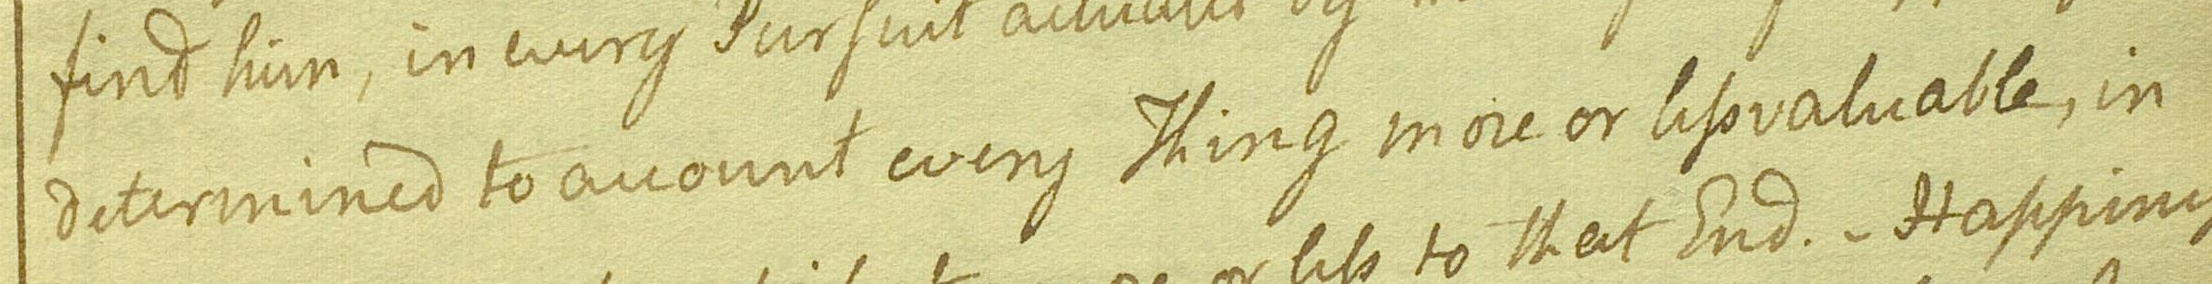determined to account every Thing more or less valuable, in
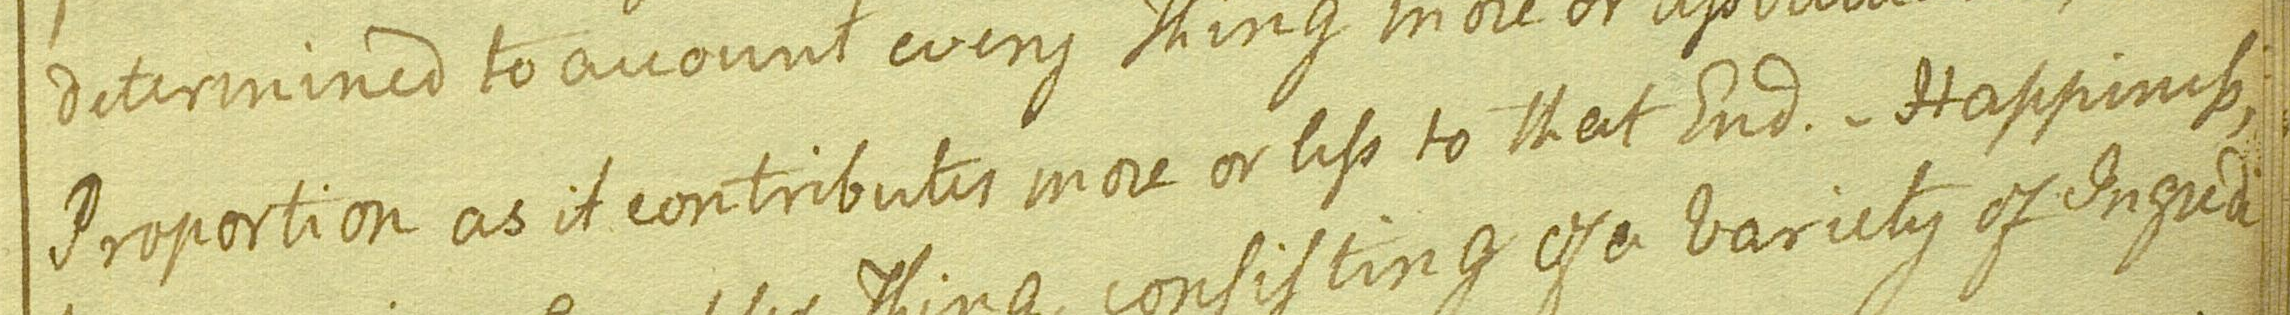Proportion as it contributes more or less to that End.- Happiness,
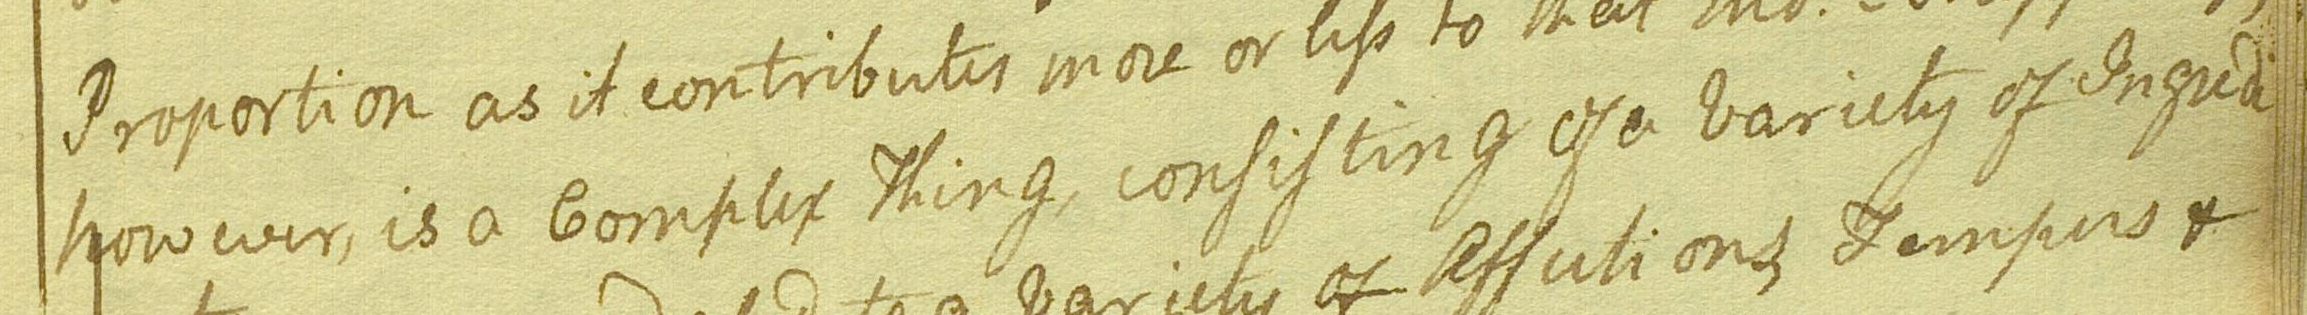however, is a complex Thing, consisting of a variety of Ingredi
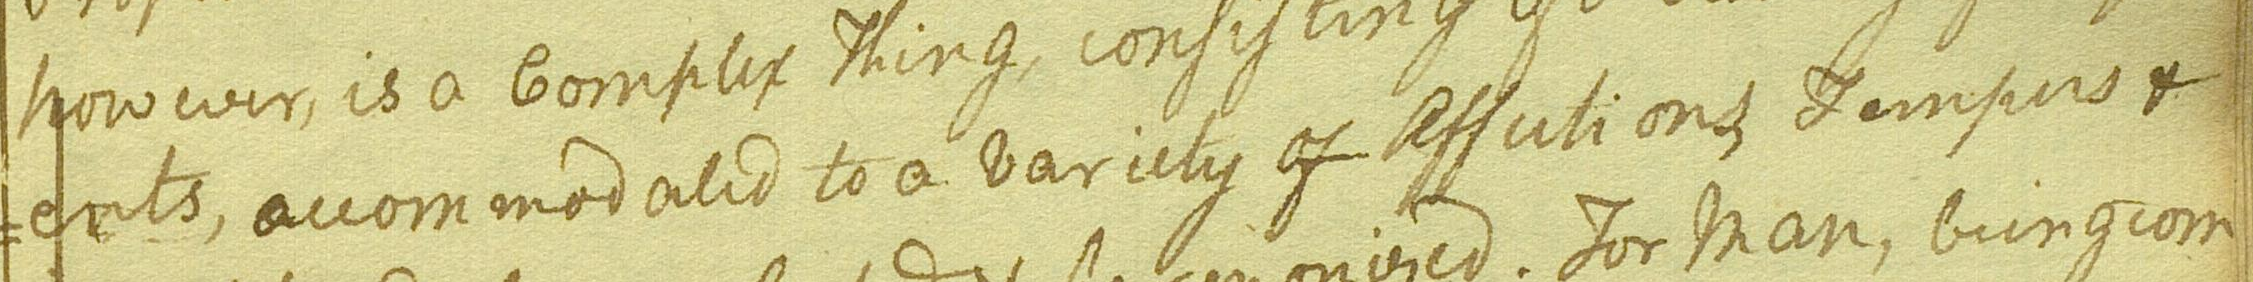-ents, accommodated to a variety of Affections, Tempers &
